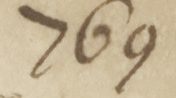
769
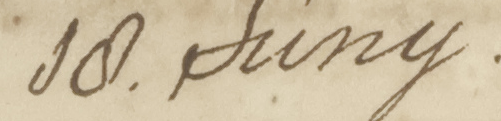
18. Junij
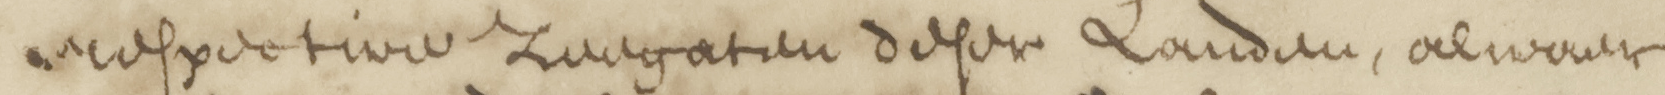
respective Zeegaten deser Landen, alwaer
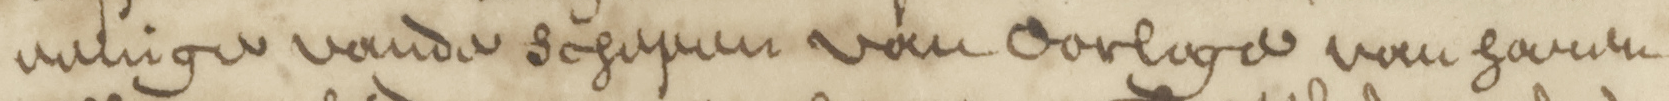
eenige vande schepen van Oorloge van haren
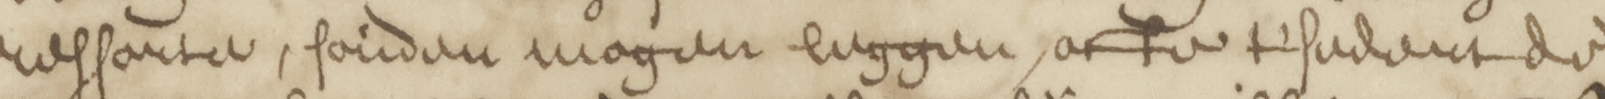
ressorte, souden mogen leggen, ofte t'sedert de
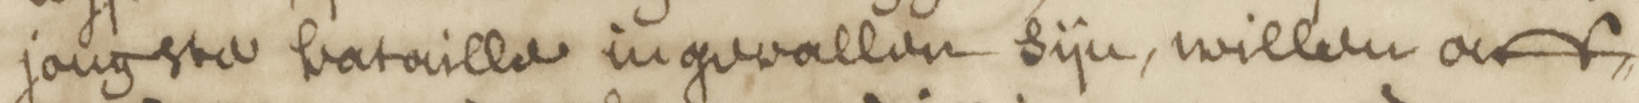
jongste bataille ingevallen sijn, willen aff„
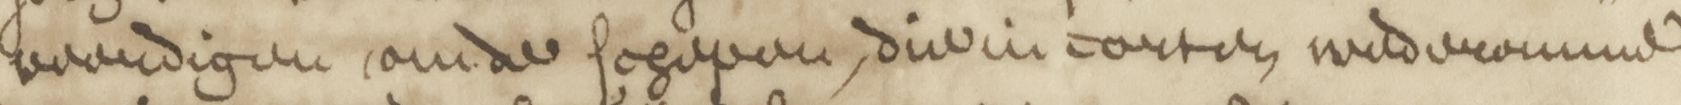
veerdigen, om de schepen, die in corten wederomme
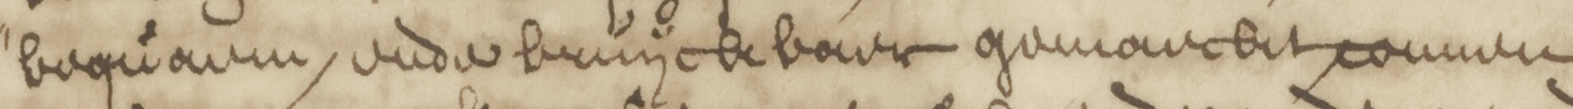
bequaem, ende bruijckbaer gemaeckt connen
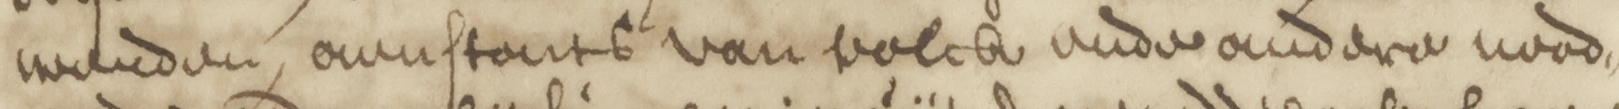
werden, aenstants van volck ende andere nood,,
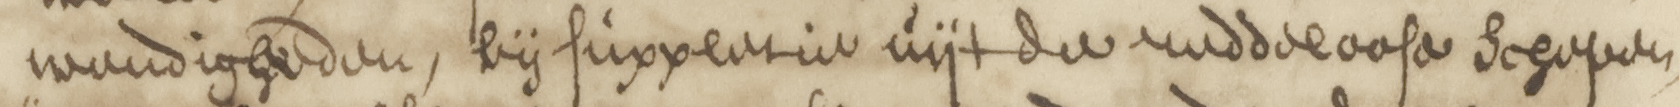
,,wendigheden, bij suppletie uijt de reddeloose schepen
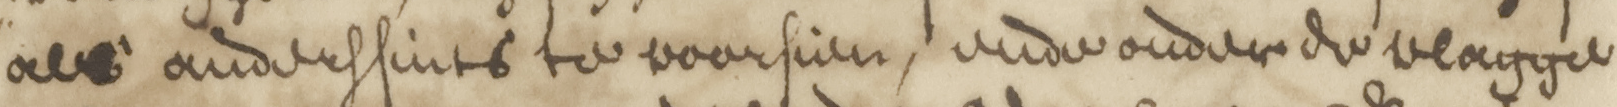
als anderssints te voorsien, ende onder de vlagge
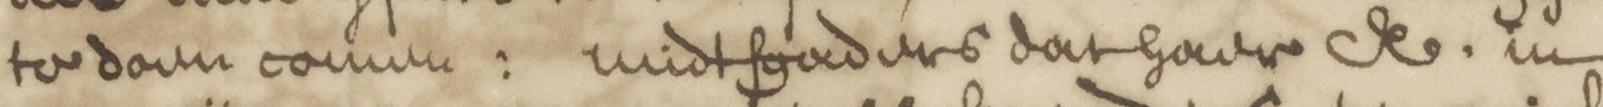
te doen comen: midtsgaders dat haer E. in
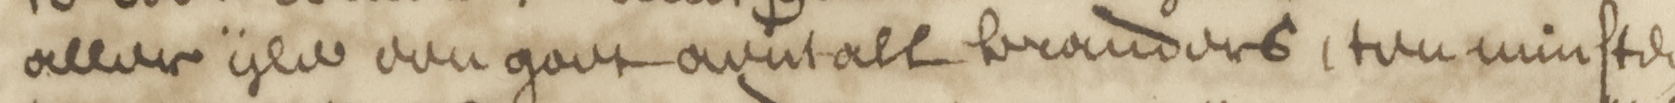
aller ijle een goet aentall branders, ten minste
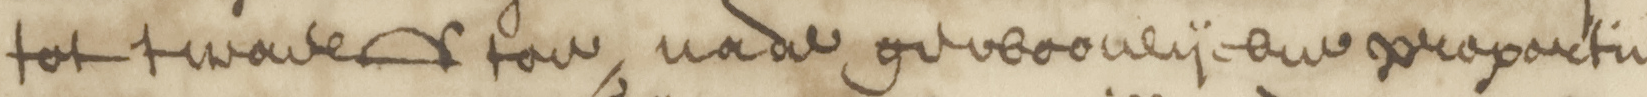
tot twaelff toe, nade gewoonlijcke proportie
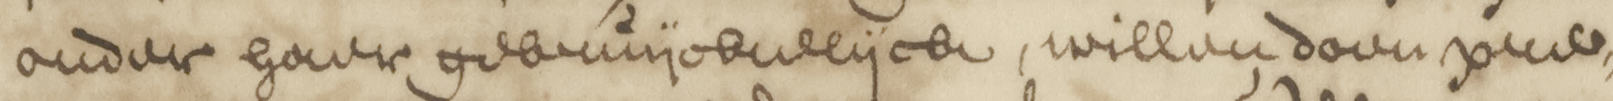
onder haer gebruijckelijck, willen doen pre,,
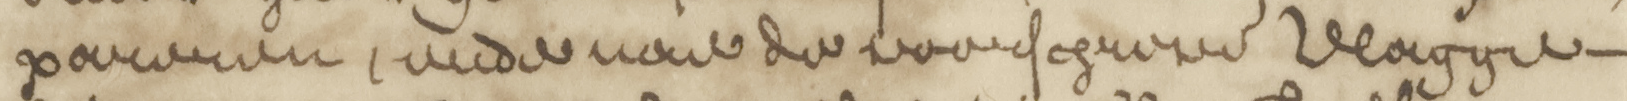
,,pareren, ende nae de voorschreve Vlagge —
